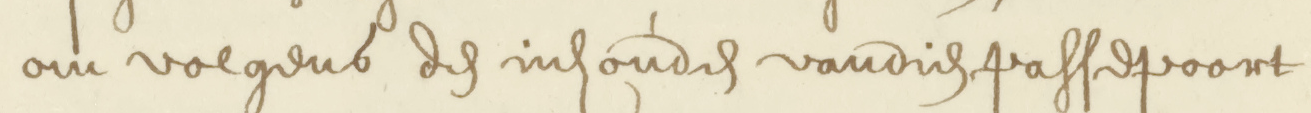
om volgens den inhouden vandien passepoort
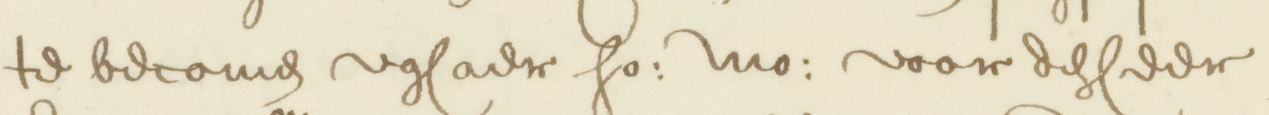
te becomen van haer ho:Mo: voor den heer
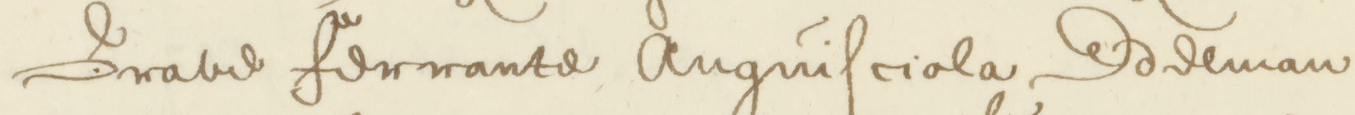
Grave Ferrante Anguisciola Edelman
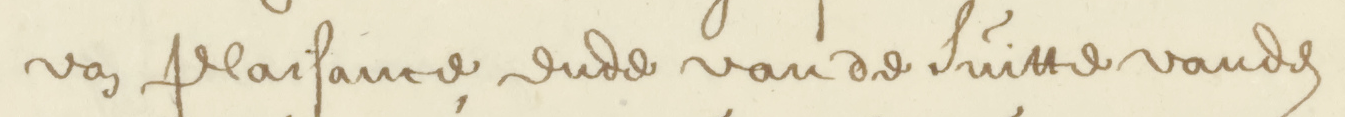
van Plaisance, ende van de Suitte vanden
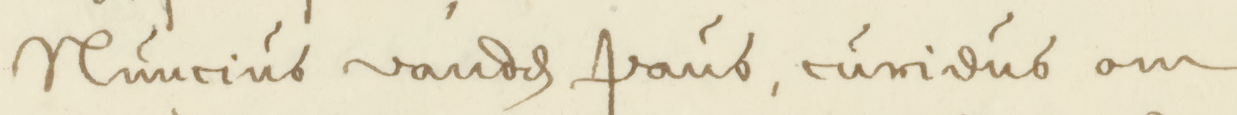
Nuncius vanden Paus, curieus om
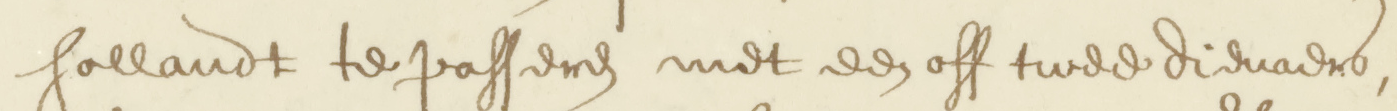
hollandt te passeren met een off twee dienaers.
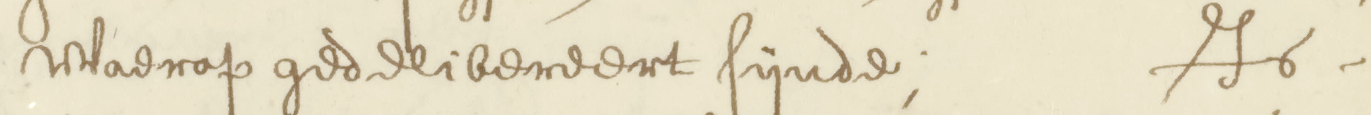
Waerop gedelibereert sijnde; Is
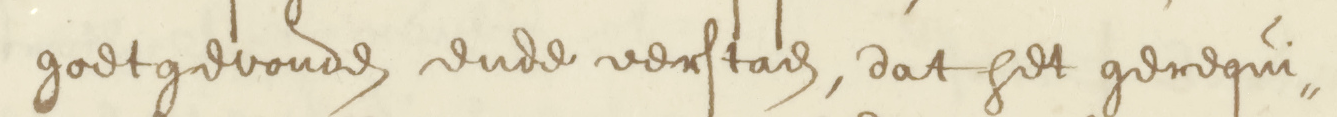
goetgevonden ende verstaen, dat het gerequi„
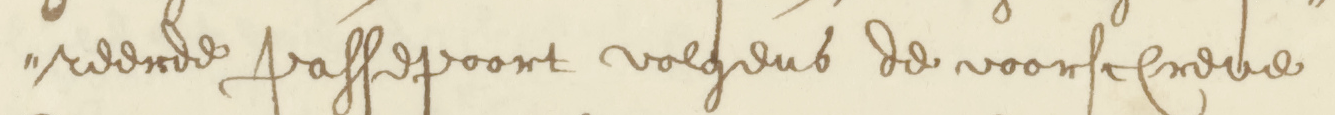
„reerde passepoort volgens de voorschreve
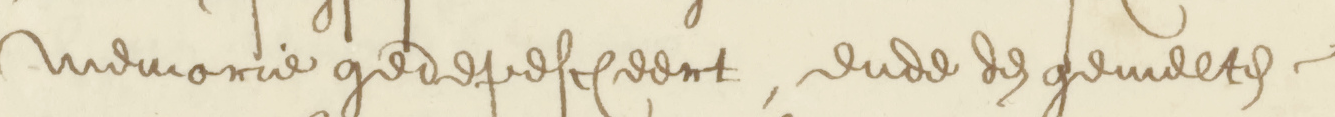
memorie gedepescheert, ende den gemelten
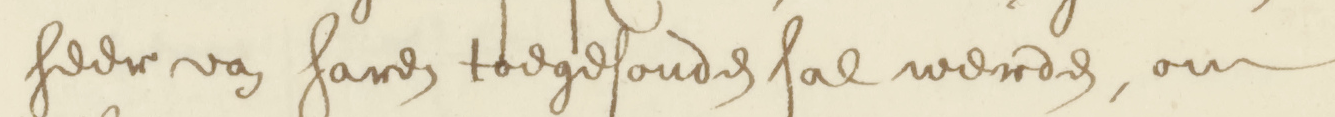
heer van Haren toegesonden sal werden, om
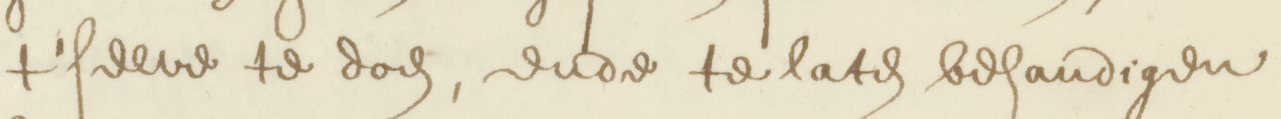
t'selve te doen, ende te laten behandigen
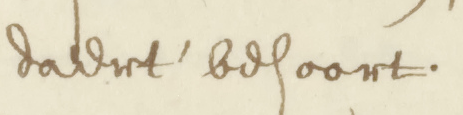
daert' behoort.
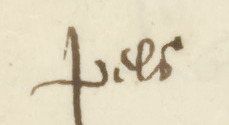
Pels
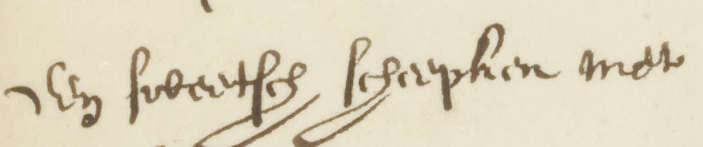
Een sweetsch scheepken met
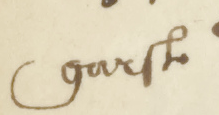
garst
